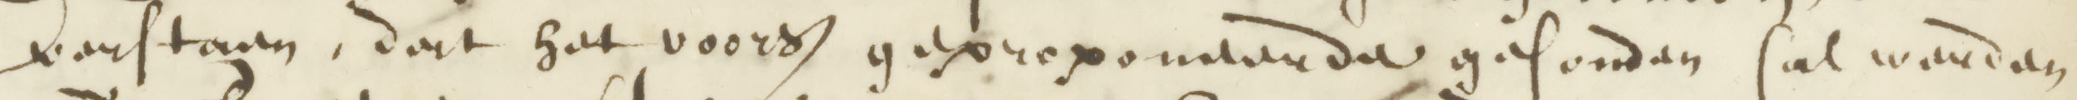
verstaen, dat het voors geproponeerde gesonden sal werden
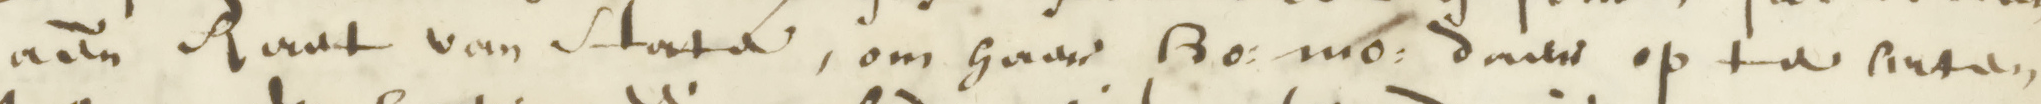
aen Raet van State, om haer Ho:Mo: daer op te laten
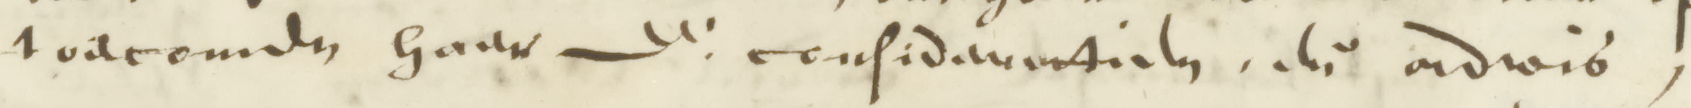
toecomen haer E. consideratien, en advis.
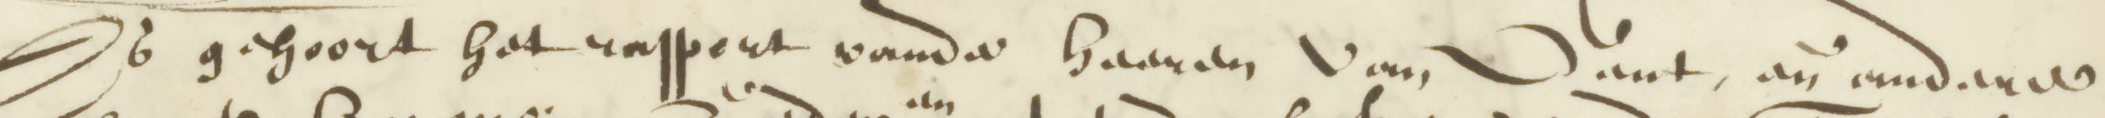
Is gehoort het rapport vande heeren van Gent, en andere
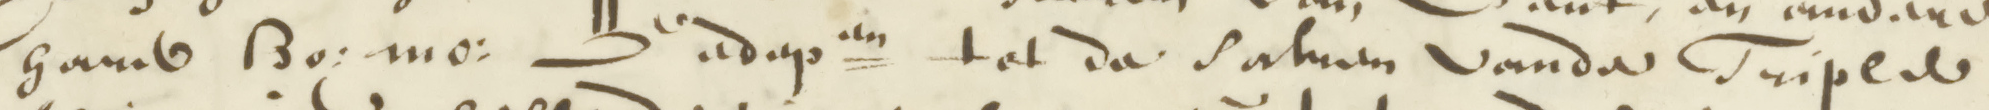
hare Ho:Mo: Gedepen tot de saken vande Triple
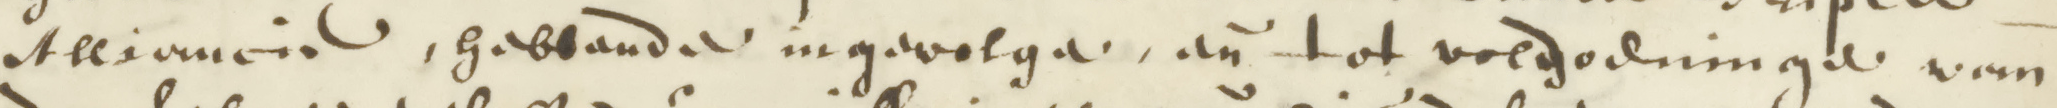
Alliancie, hebbende ingevolge, en tot voldoeninge van
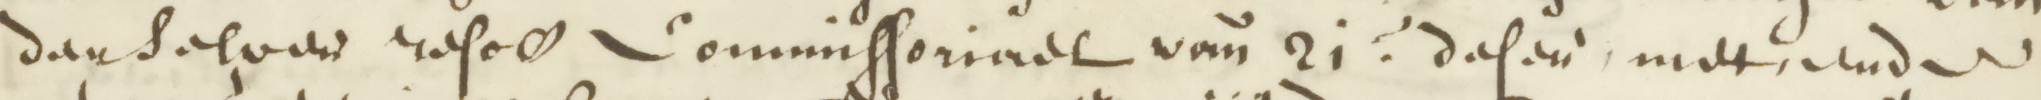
der selver resol Commissoriael van 21e. deser, met ende
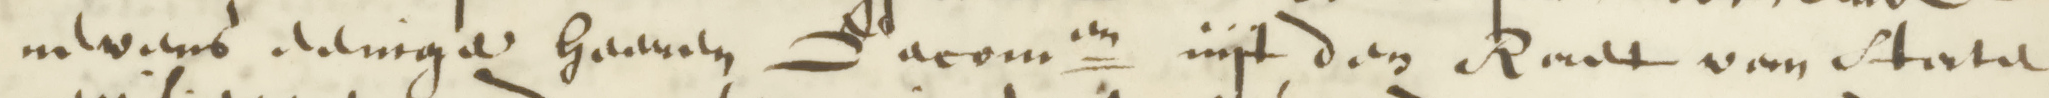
nevens eenige heeren Gecomen uijt den Raet van State
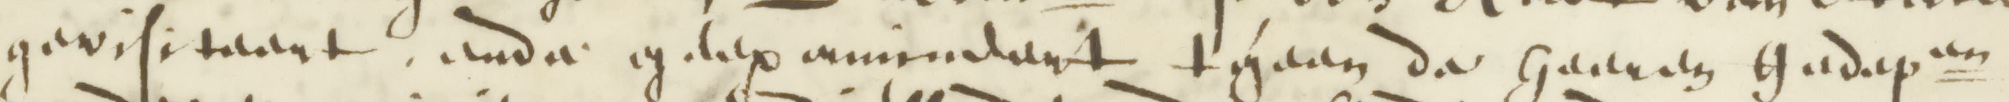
gevisiteert, ende geexamineert t'geen de heeren Gedepen
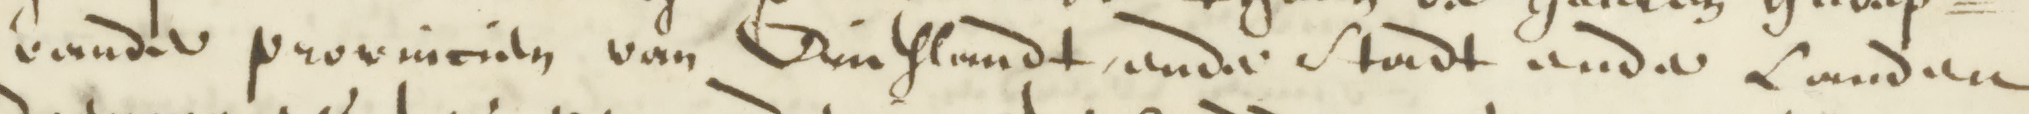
vande provincien van Vrieslandt, ende Stadt ende Landen
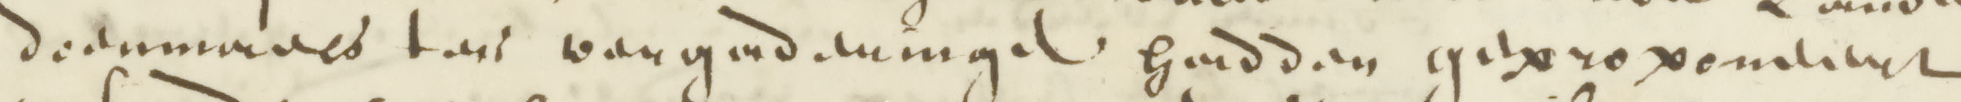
doenmaels ter vergaderinge hadden geproponeert
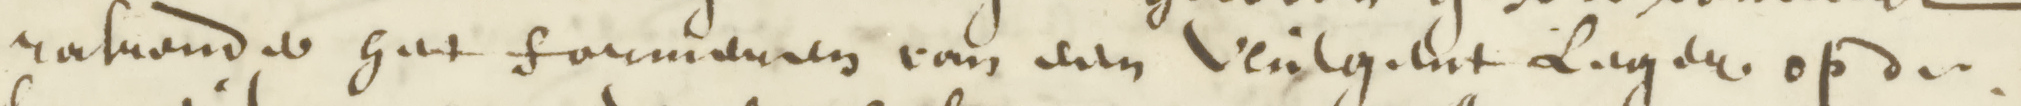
rakende het formeren van een Vliegent Leger op de
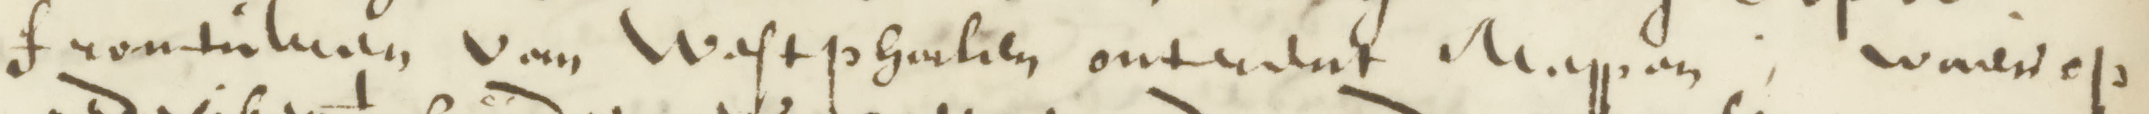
frontieren van Westphalen ontrent Meppen; Waerop
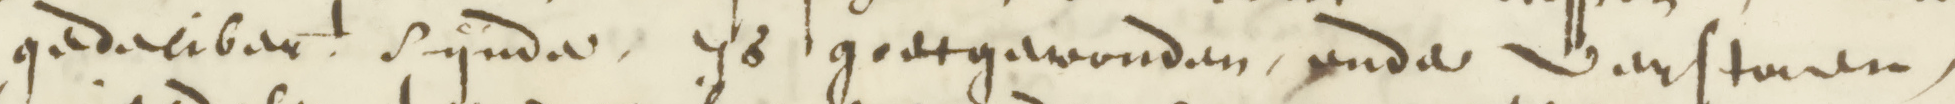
gedelibert. sijnde, Is goetgevonden, ende verstaen,
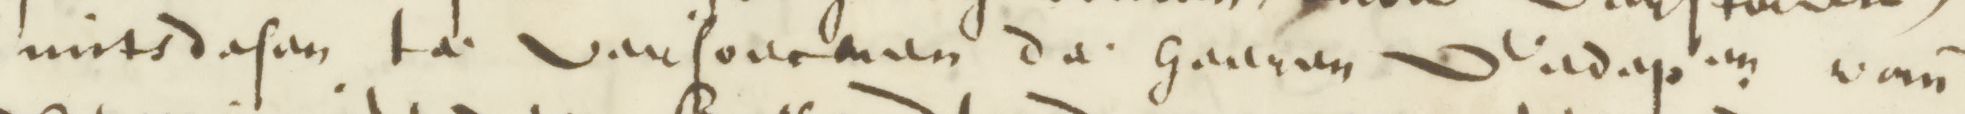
mitsdesen te versoecken de heeren Gedepen. van
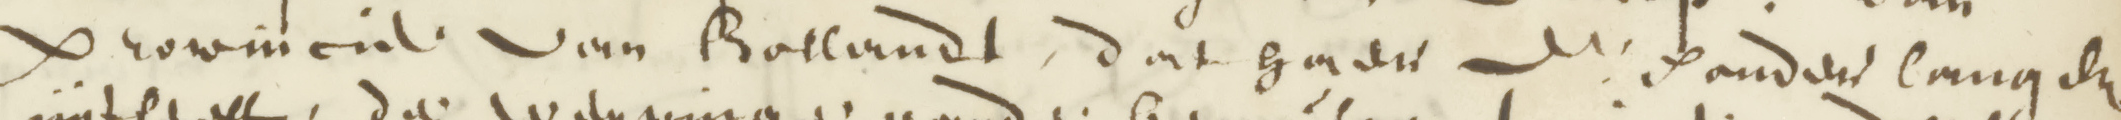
provincie van Hollandt, dat haer E. sonder langen
